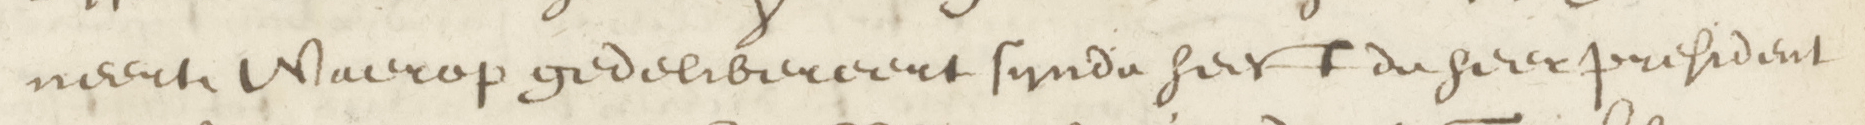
neert. Waerop gedelibereert synde heeft de heer president
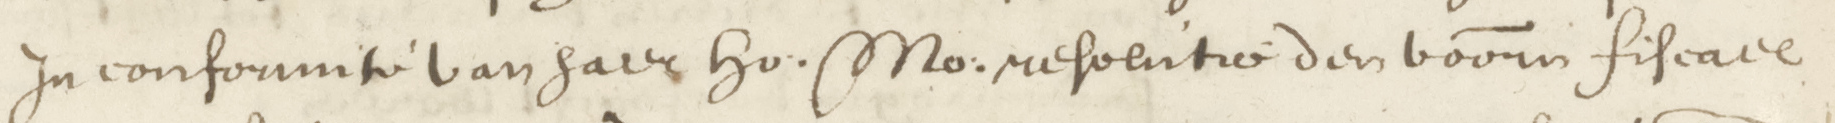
In conformité van haer Ho:Mo: resolutie den voorn fiscael
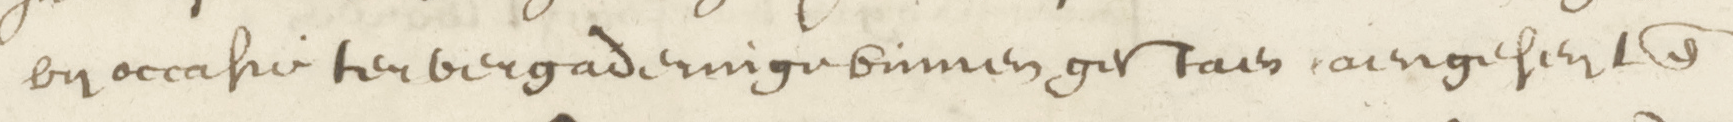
by occasie ter vergaderinge binnen gestaen, aengeseyt &
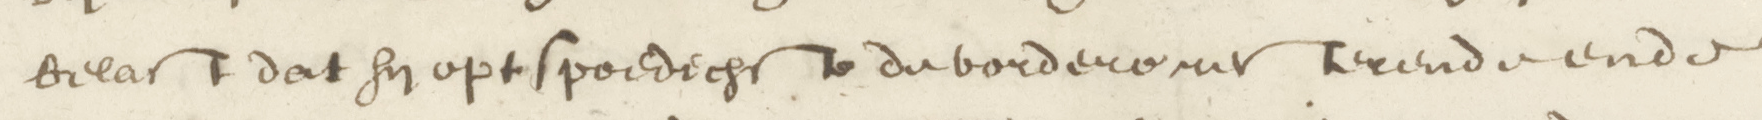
belast dat hy opt spoedichste de vordere resterende ende
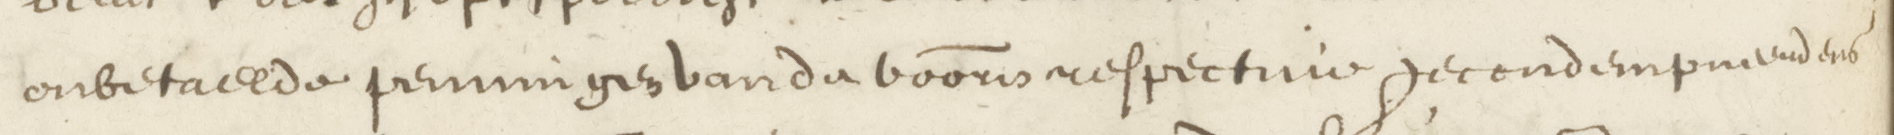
onbetaelde penningen van de voorn respectiue gecondempneerdens
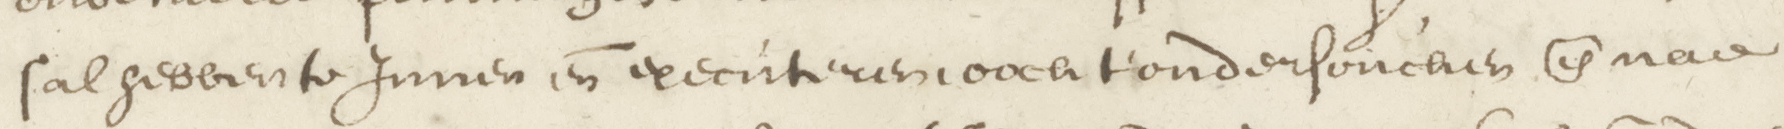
sal hebben te Innen en executeren, oock t‛ondersoucken & nae
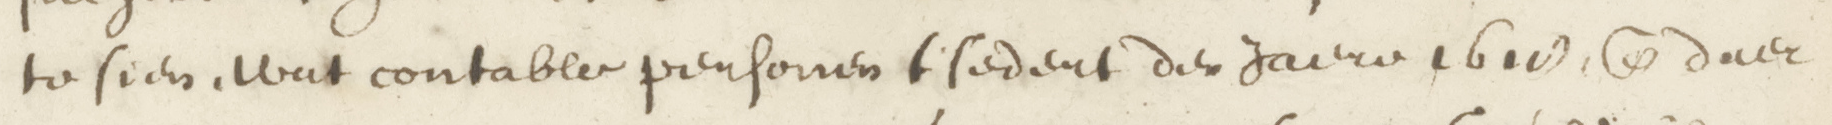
te sien, wat contable personen t'sedert den Jaere 1618, & daer
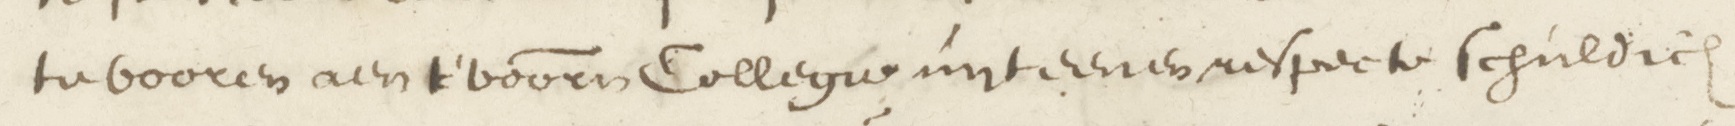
te vooren aen t'voorn Collegie uyt eenen respecte schuldich
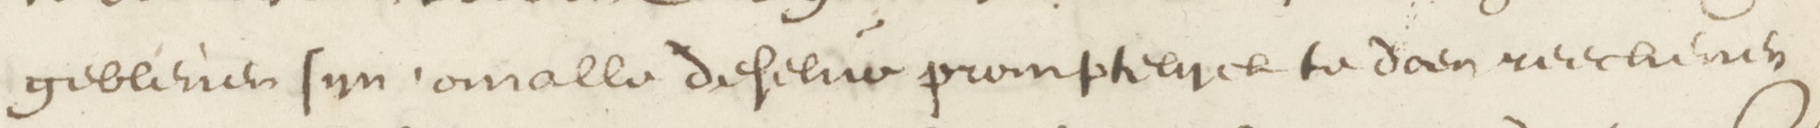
gebleven syn, om alle deselue promptelyck te doen reeckenen
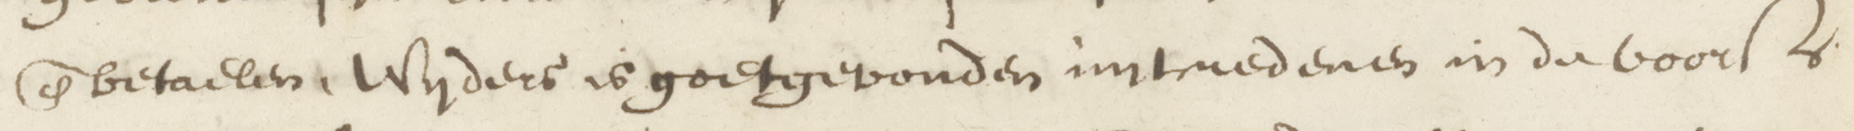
& betaelen. Wyders is goetgevonden uyt redenen in de voors
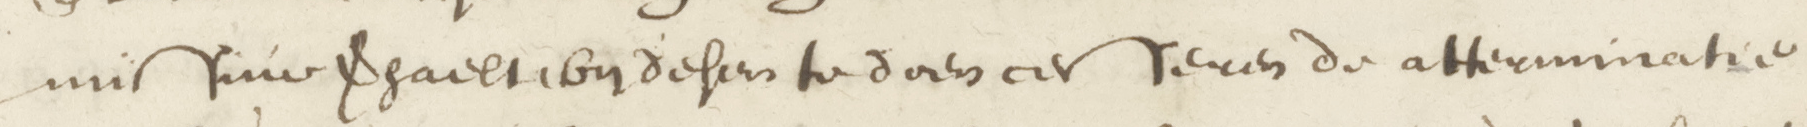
missiue vhaelt, by desen te doen cesseren de atterminatie
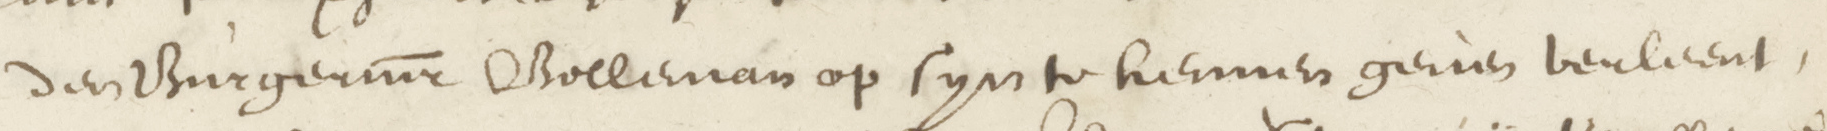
den Burgermr Bolleman op syn te kennen geuen verleent,
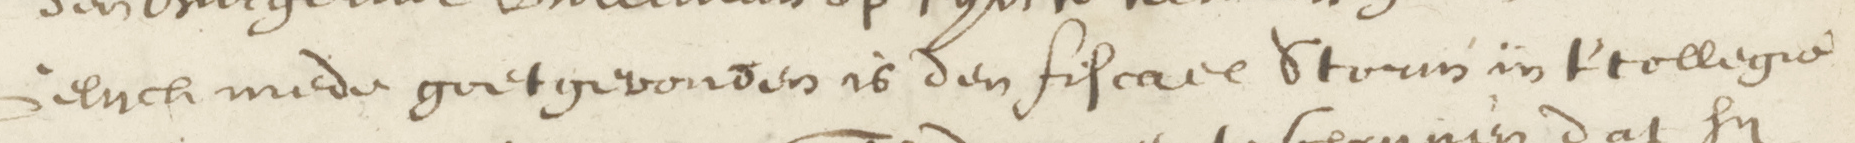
Gelyck mede goetgevonden is den fiscael Storm in t‛collegie
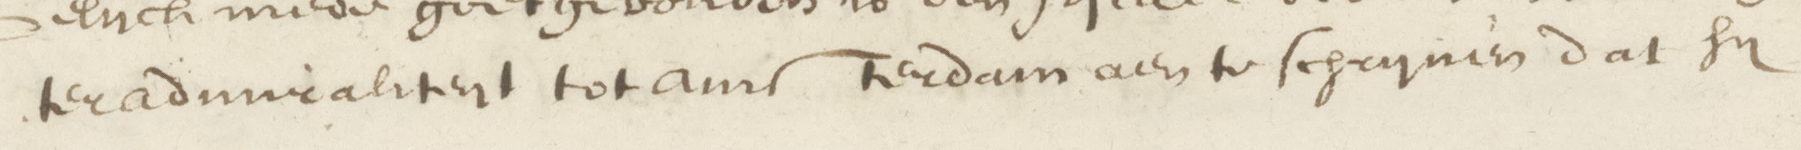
ter admiraliteyt tot Amsterdam aen te schryuen dat hy
